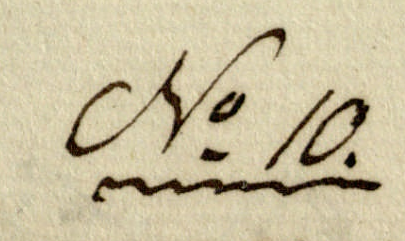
No 10 .
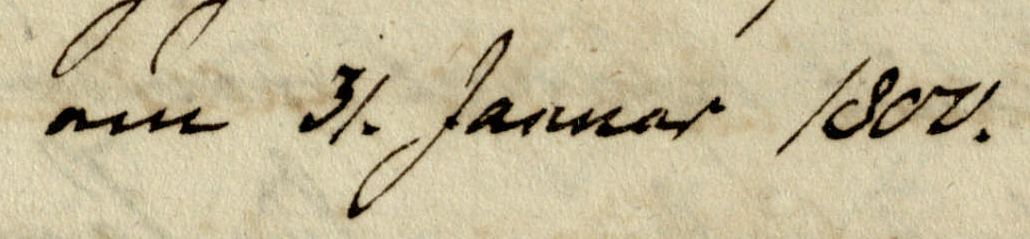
am 31. Januar 1800.
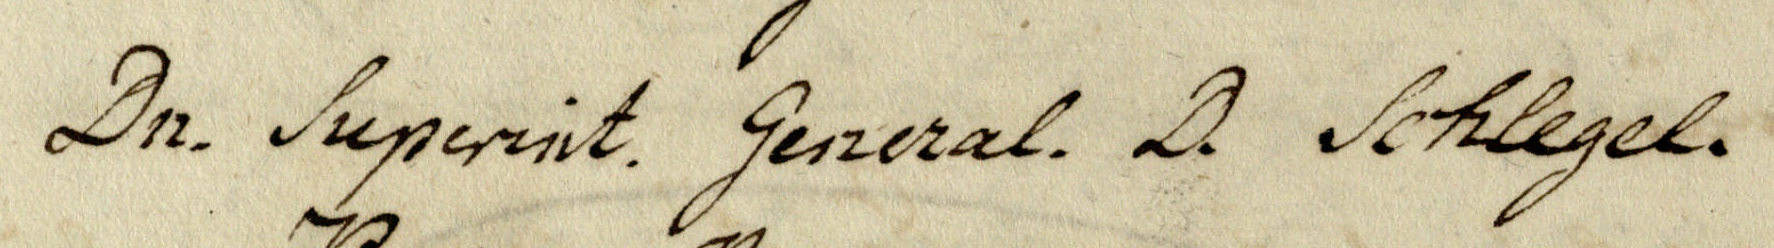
Dn. Superint. General. D. Schlegel.
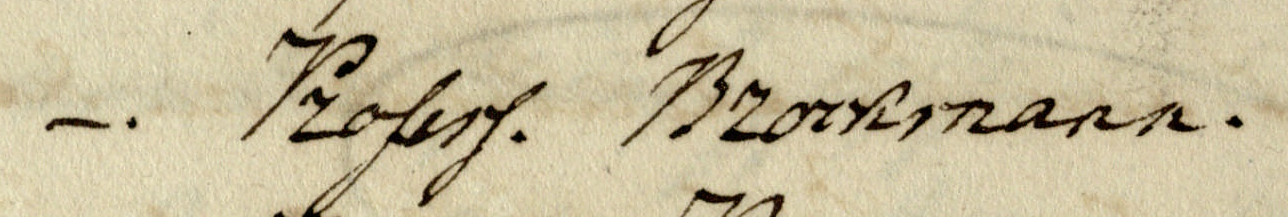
Profess. Brockmann.
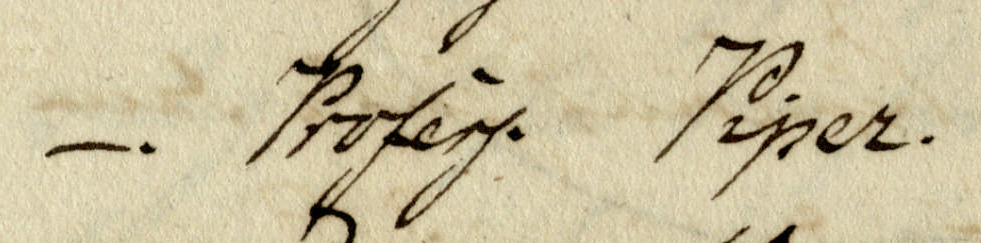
Prof Piper.
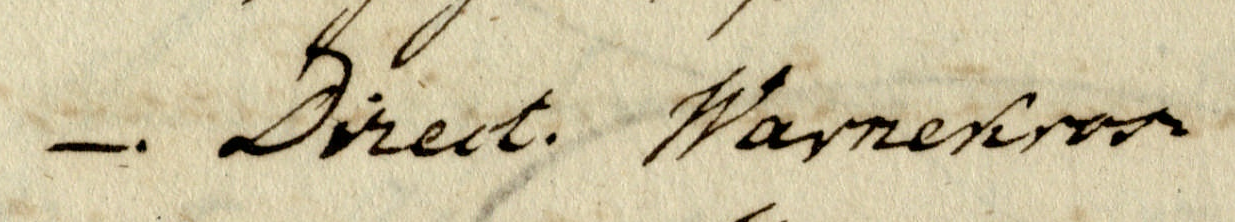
Direct. Warnekros.
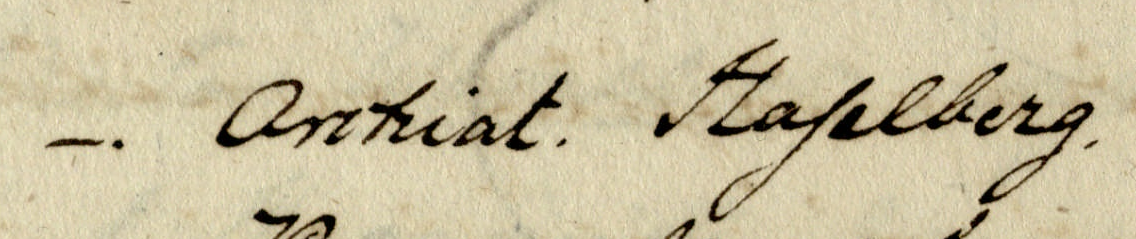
Archiat. Haselberg.
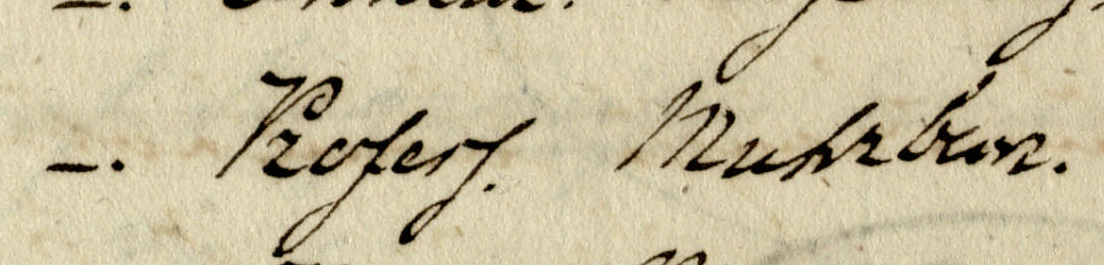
Profess. Muhrbeck.
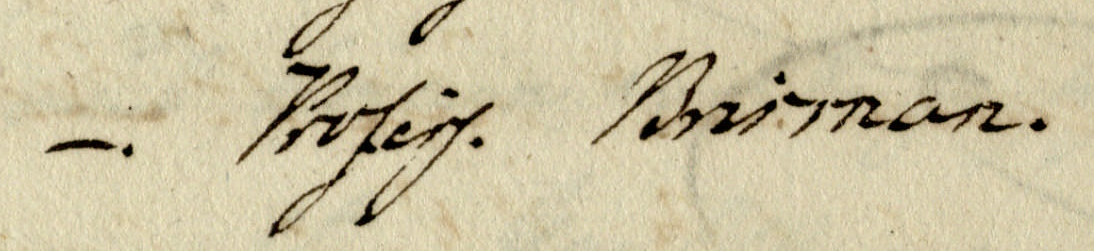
Profess. Brisman.
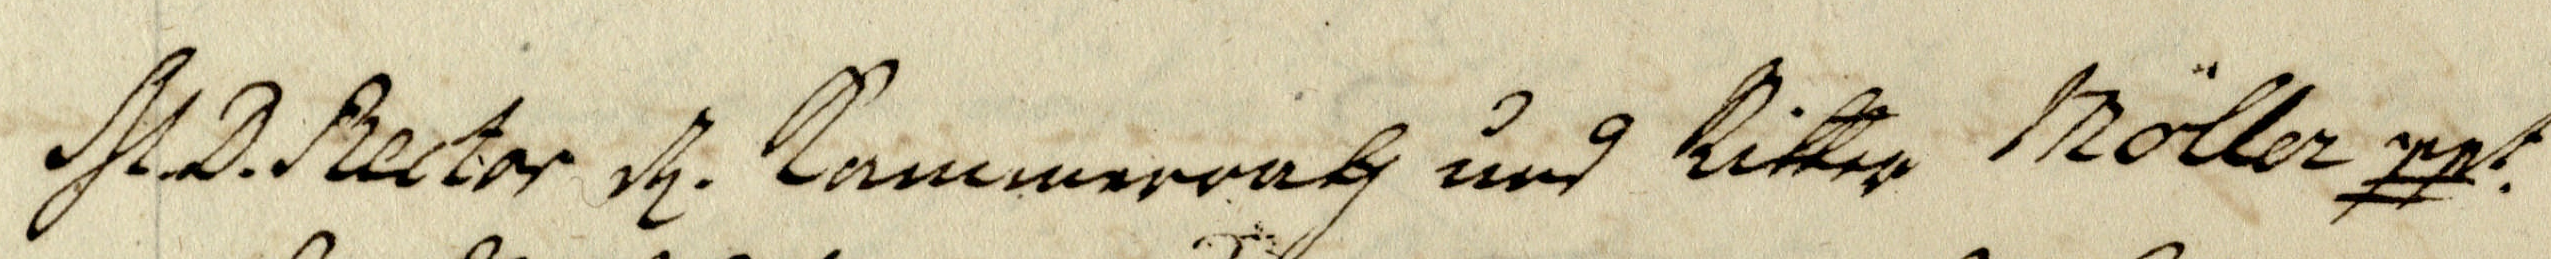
M. D. Rector dh. Kammerrath und Ritter Möller ppt.
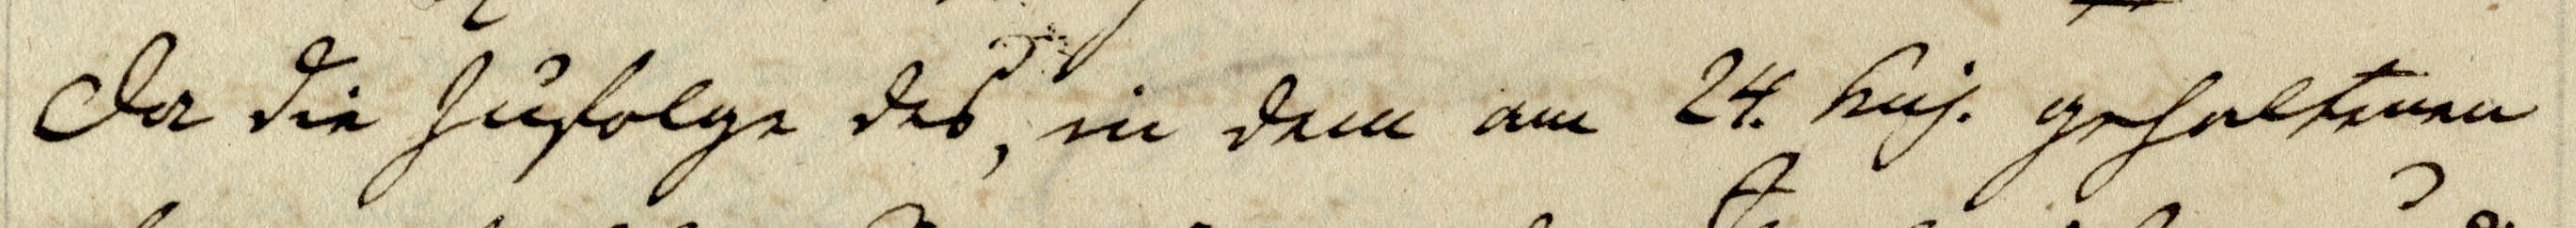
Da die zufolge des, in dem am 24. huj. gehaltenen
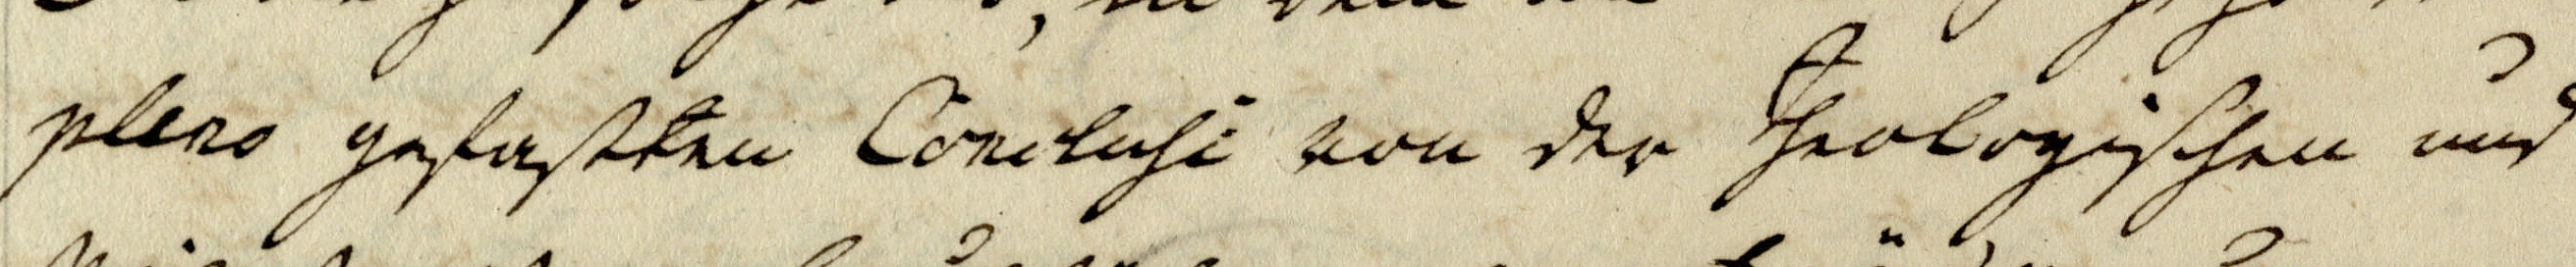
pleno gefaßten Conclusi von der Theologischen und
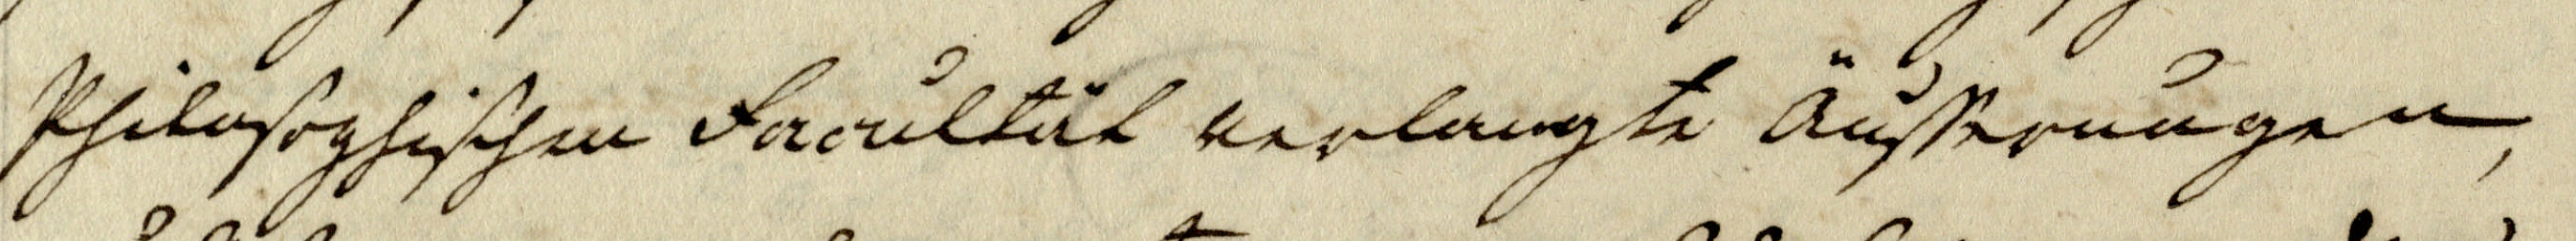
Philosophischen Facultät verlangte Äusserungen,
